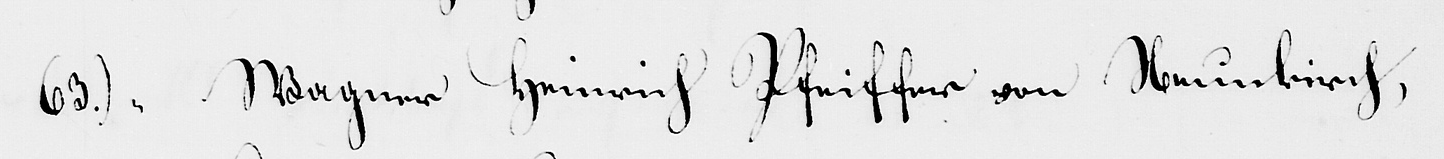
63.) " Wagner Heinrich Pfeiffer von Neunkirch,
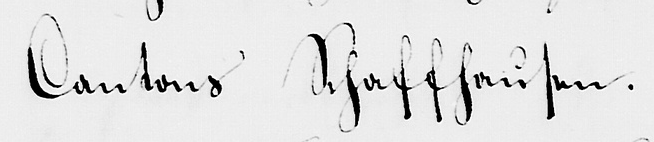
Cantons Schaffhausen.
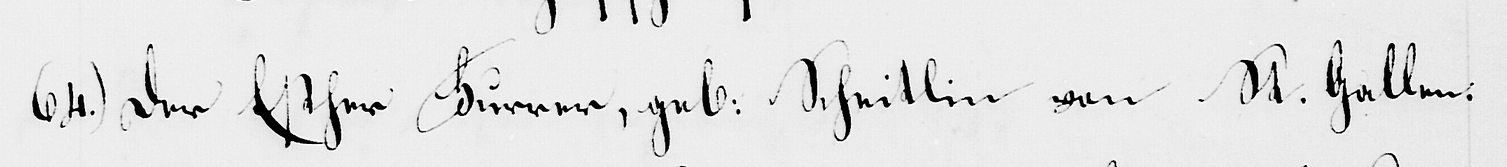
64.) der Esther Furrer, geb: Scheitlin von St. Gallen.
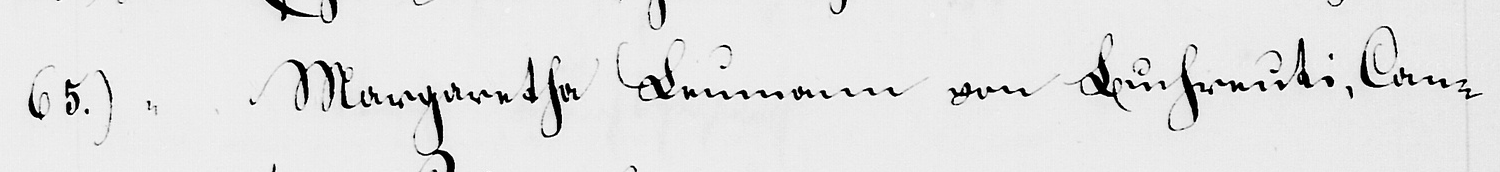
65.) " Margaretha Leumann von Buchreuti, Can¬
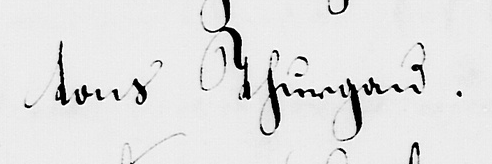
tons Thurgau.
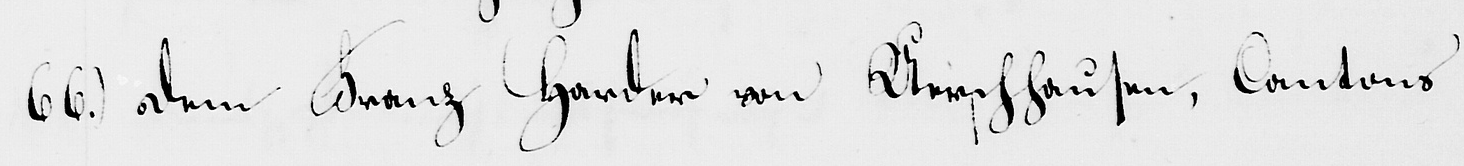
66.) dem Franz Harder von Uerschhausen, Cantons
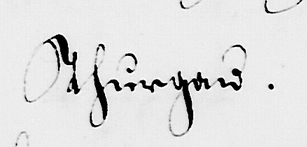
Thurgau.
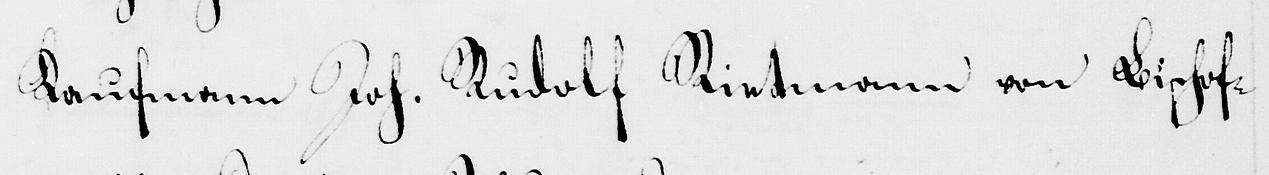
aufmann Joh. Rudolf Rietmann von Bischof¬
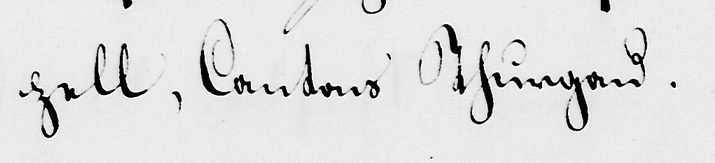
zell, Cantons Thurgau.
